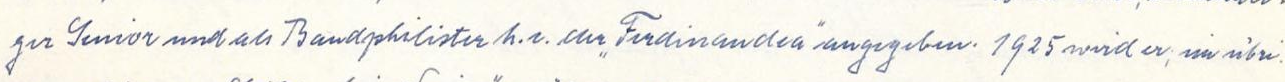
ger Senior und als Bandphilister h.c. der „Ferdinandea“ angegeben. 1925 wird er im übri-
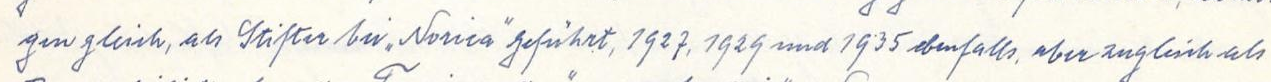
gen gleich als Stifter bei „Norica“ geführt, 1927 und 1929 und 1935 ebenfalls, aber zugleich
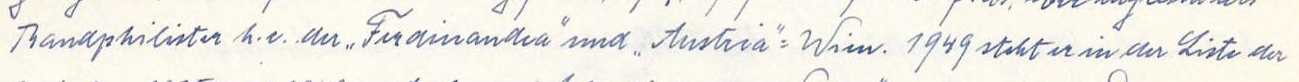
als Bandphilister h. c. der „Ferdinandea“ und „Austria“ Wien. 1949 steht er in der Liste der
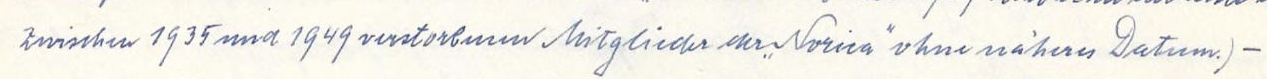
zwischen 1935 und 1949 verstorbenen Mitglieder der „Norica“ ohne näheres Datum.)-
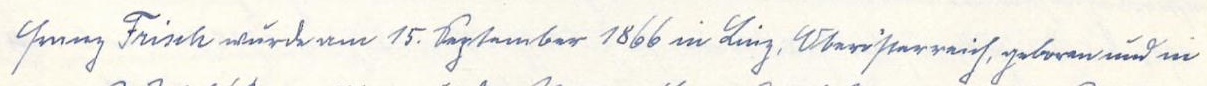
Franz Frisch wurde am 15. September 1886 in Linz, Oberösterreich, geboren und in
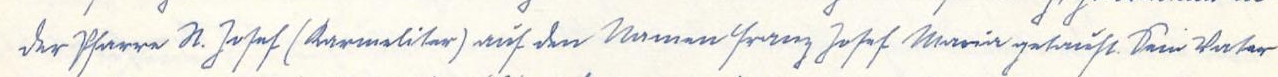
der Pfarre St. Josef (Karmeliter) auf den Namen Franz Joseph Maria getauft. Sein Vater
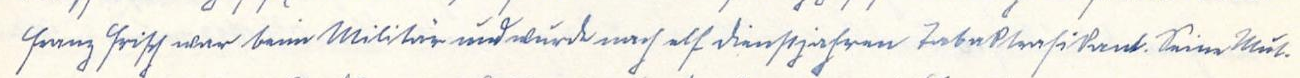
Franz Frisch war beim Militär und wurde nach elf Dienstjahren Tabaktrafikant. Seine Mut-
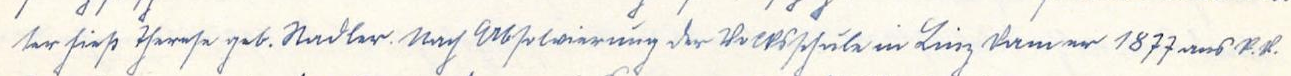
ter hieß Therese geb. Nadler. Nach Absolvierung der Volksschule in Linz kam er 1877 ans k k
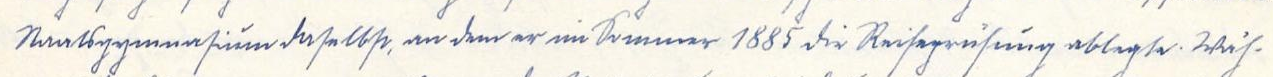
Staatsgymnasium daselbst, an dem er im Sommer 1885 die Reifeprüfung ablegte. Wäh-
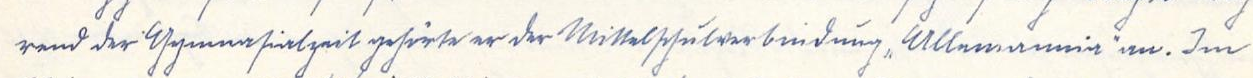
rend der Gymnasialzeit gehörte er der Mittelschulverbindung „Allemannia“ an. Im
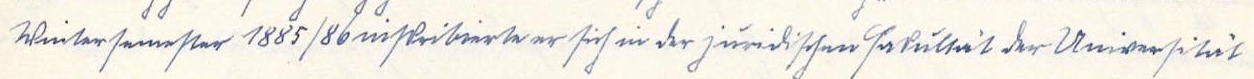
Wintersemester 1885/86 inskribierte er sich in der juridischen Fakultät der Universität
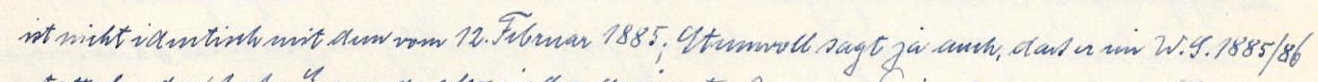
ist nicht identisch mit dem vom 12. Februar 1885. Stummvoll sagte ja auch, dass er im W.S. 1885/86
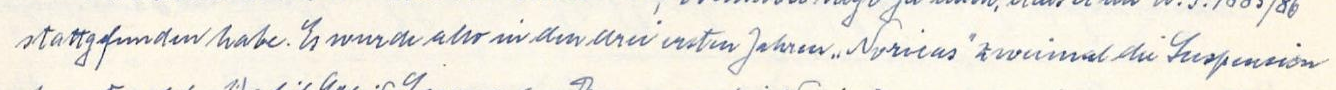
stattgefunden habe. Es wurde aber in den drei ersten Jahren „Norica“ zweimal die Suspension
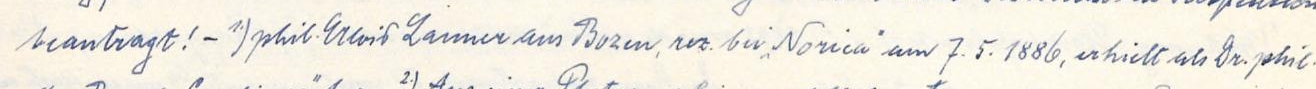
beantragt! – 1) phil Alois Lanner aus Bozen, rez. bei „Norica“ am 7.5.1886 erhielt als Dr. phil
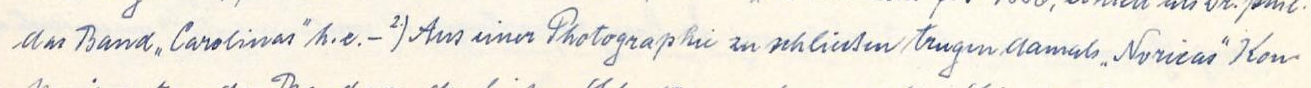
das Band „Carolinas“ h.c. – 2) Aus einer Photographie zu schließen trugen damals „Noricas“ Kon-
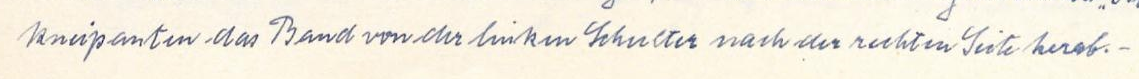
kneipanten das Band von der linken Schulter nach der rechten Seite herab.
